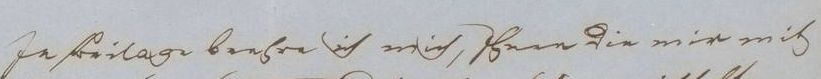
In Beilage beehre ich mich, Ihnen die mir mit
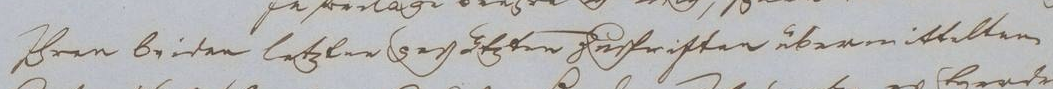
Ihren beiden letzten geschätzten Zuschriften übermittelten
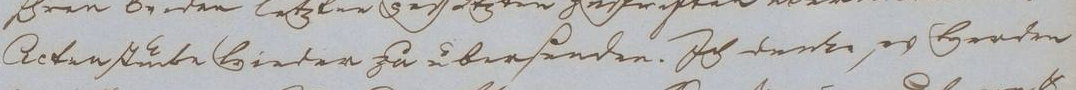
Actenstücke wieder zu übersenden. Ich denke, es werden
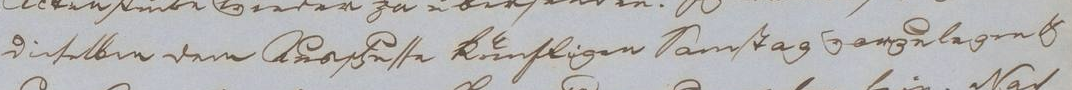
dieselben dem Ausschusse künftigen Samstag vorzulegen &
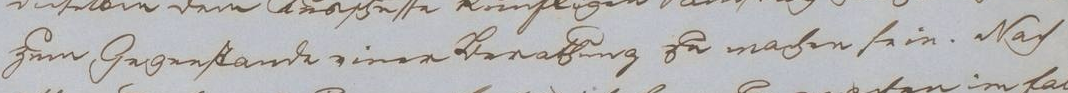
zum Gegenstande einer Berathung zu machen sein. Nach
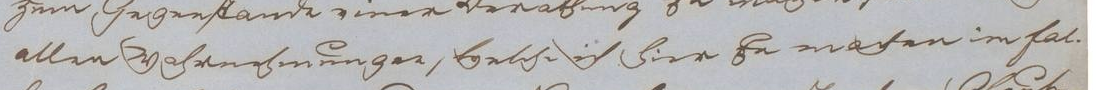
allen Wahrnehmungen, welche ich hier zu machen im Fal-
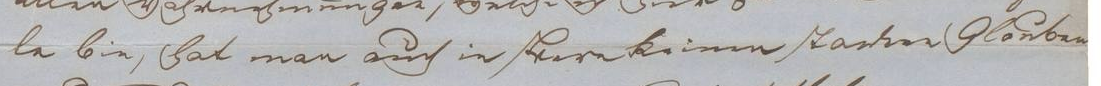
le bin, hat man auch in Bern keinen starken Glauben
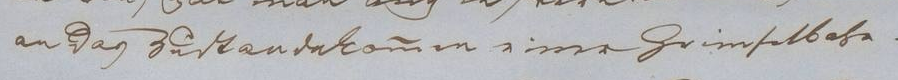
an das Zustandekommen einer Grimselbahn.
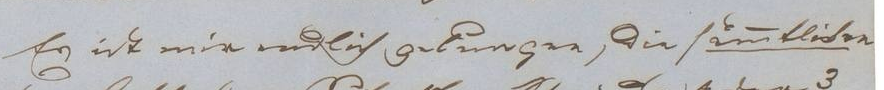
Es ist mir neulich gelungen, die sämmtlichen
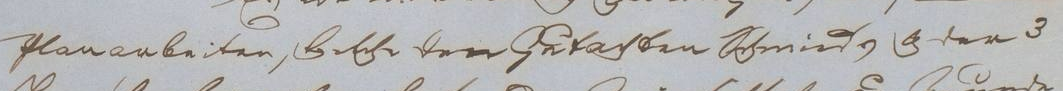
Planarbeiten, welche dem Gutachten Schmid's & der 3
